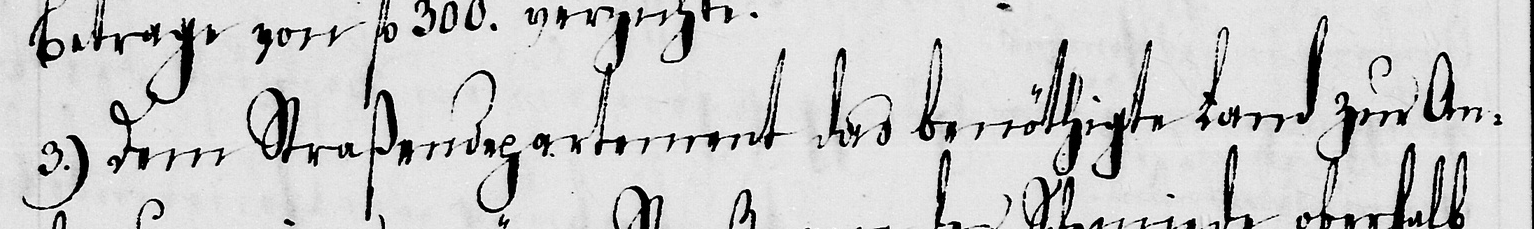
3.) Dem Straßendepartement das benöthigte Land zur An¬
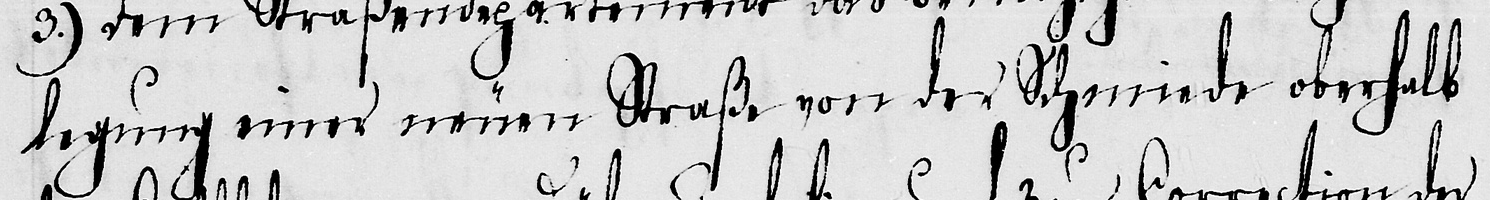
legung einer neuen Straße von der Schmiede oberhalb
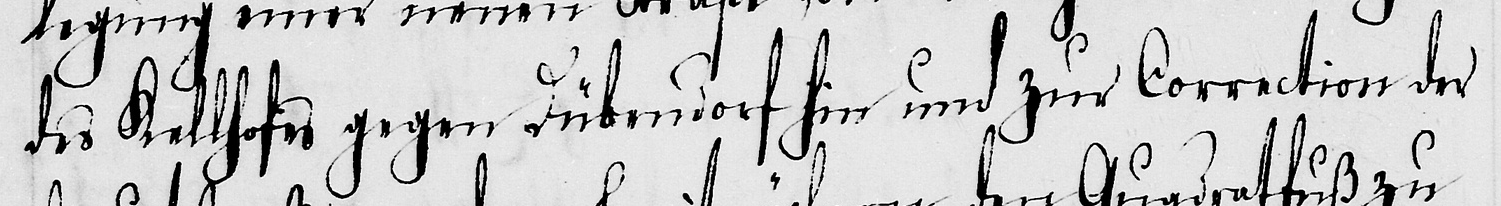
des Kellhofes gegen Dübendorf hin und zur Correction der
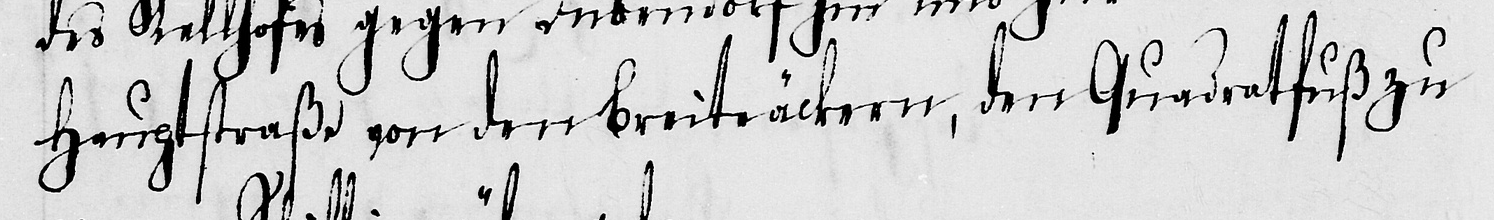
Hauptstraße von den Breiteäckern, den Quadratfuß zu
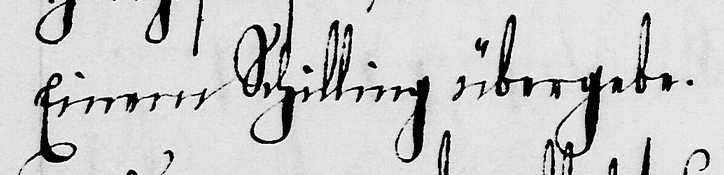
Einem Schilling übergebe.
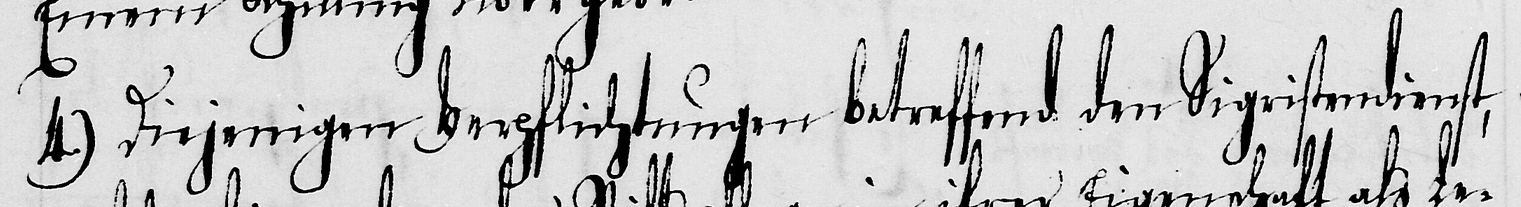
4.) Diejenigen Verpflichtungen betreffend den Sigristendien¬
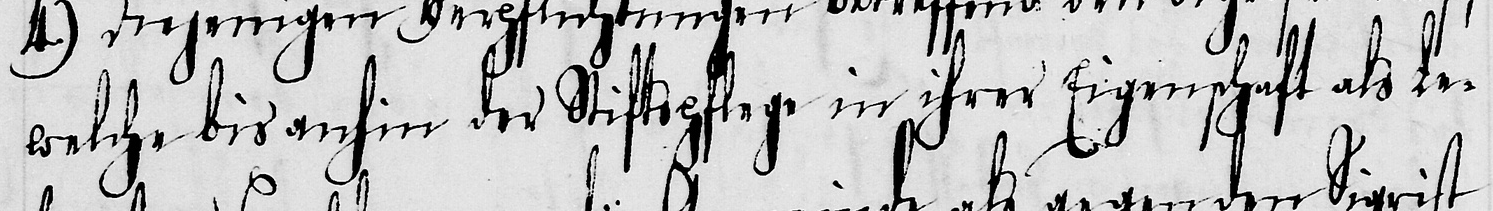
welche bis anhin der Stiftspflege in ihrer Eigenschaft als Le¬
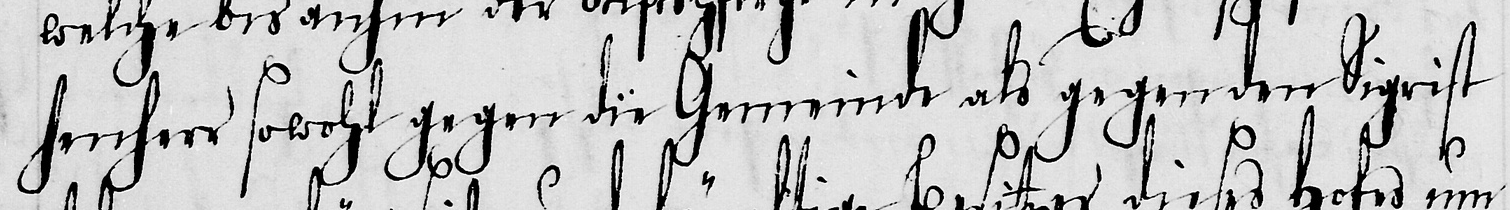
henherr sowohl gegen die Gemeinde als gegen den Sigrist
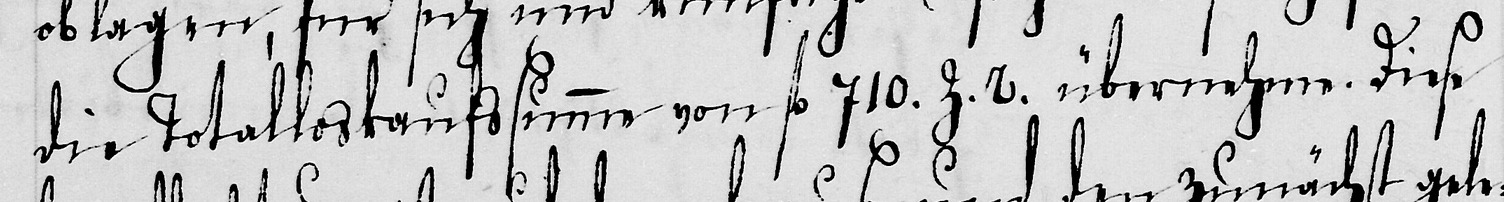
die Totalloskaufssumme von fl. 710. Z. V. übernehme. Diese
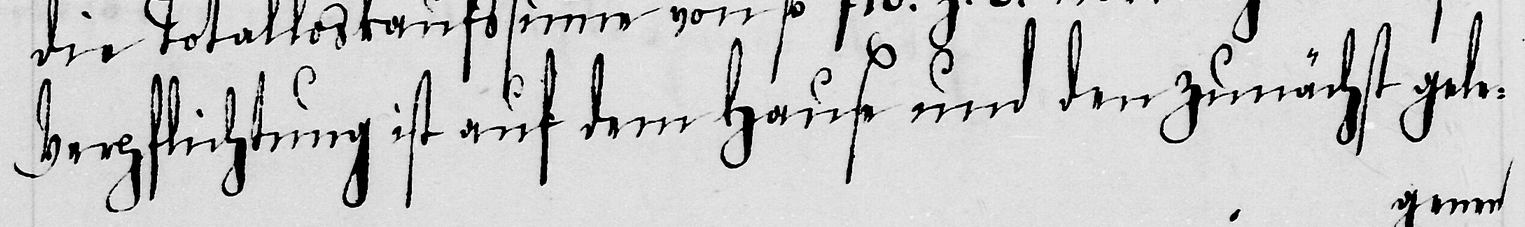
Verpflichtung ist auf dem Hause und den zunächst gel¬
